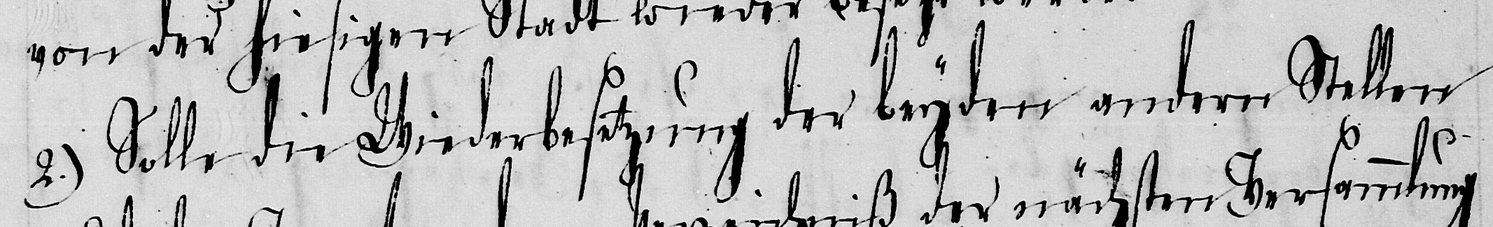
2.) Solle die Wiederbesetzung der beyden andern Stellen
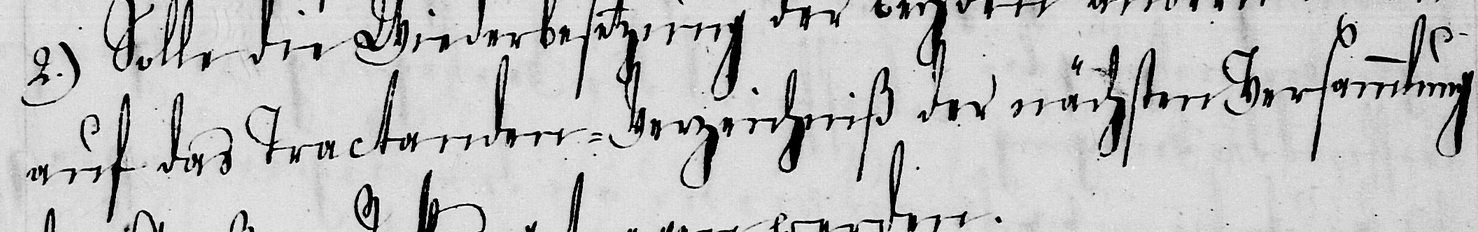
auf das Tractanden-Verzeichniß der nächsten Versammlung
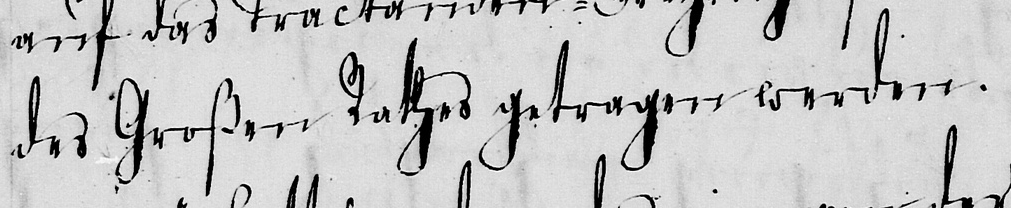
des Großen Rathes getragen werden.
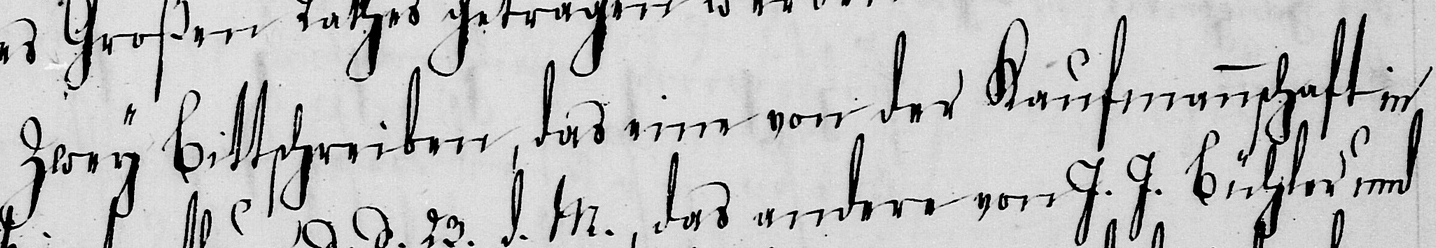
Zwey Bittschreiben, das eine von der Kaufmannschaft in
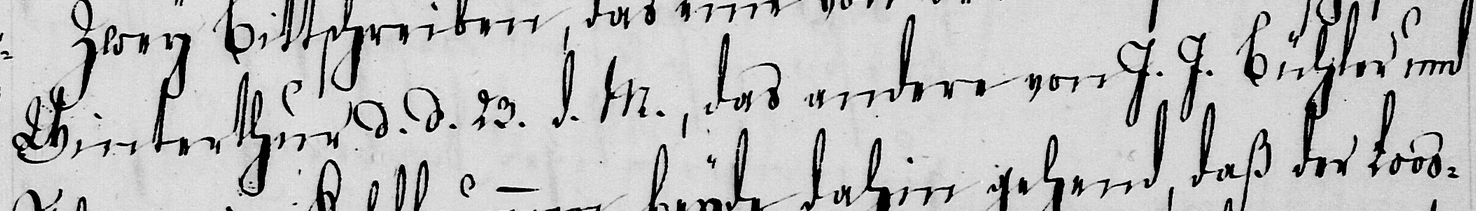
Winterthur d. d. 23. d. M., das andere von J. J. Bühler und
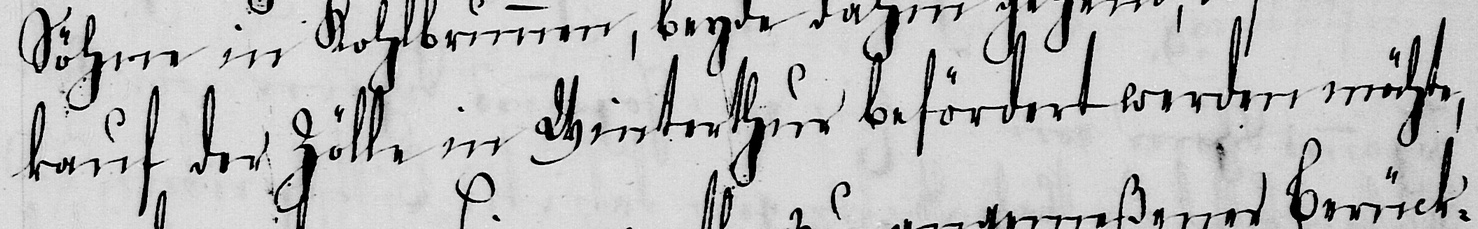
skauf der Zölle in Winterthur befördert werden möchte,
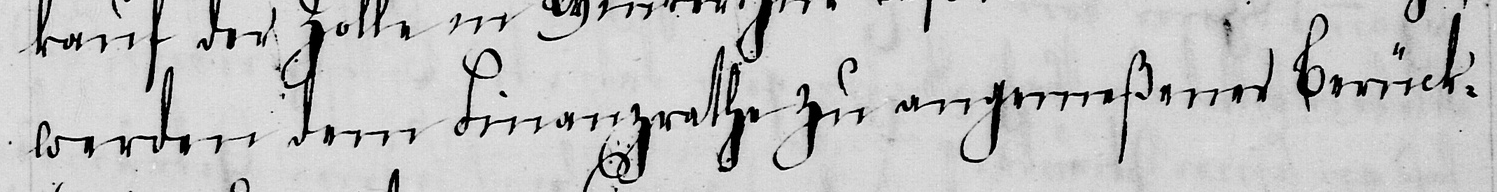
werden dem Finanzrathe zu angemeßener Berück¬
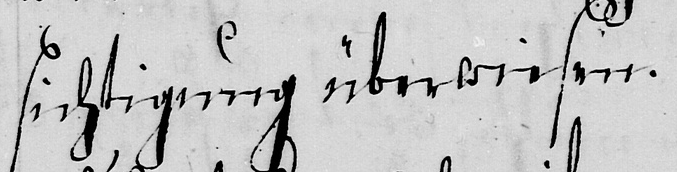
sichtigung überwiesen.
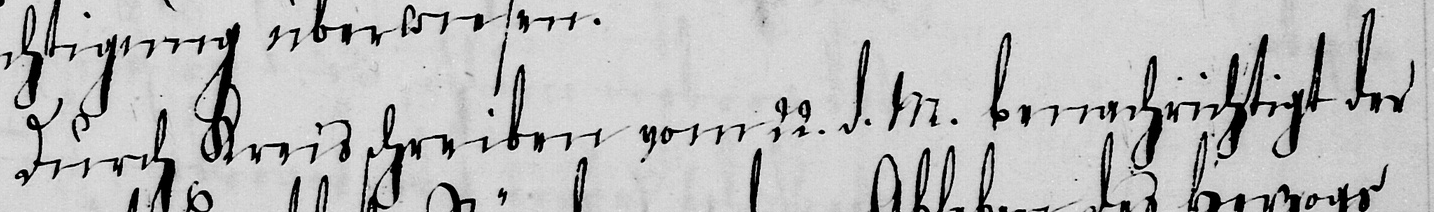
Durch Kreisschreiben vom 22. d. M. benachrichtigt der
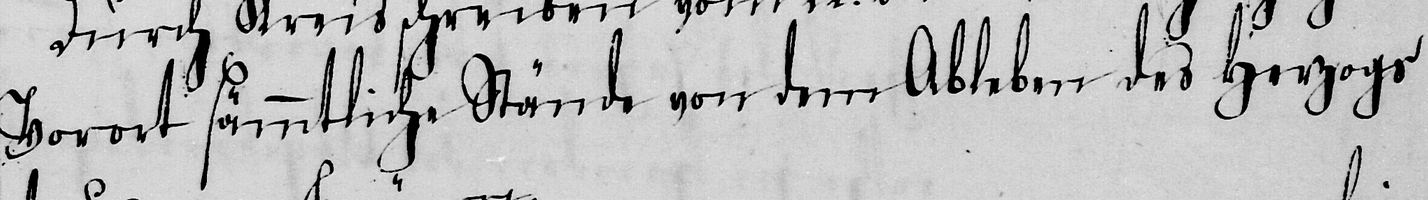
Vorort sämmtliche Stände von dem Ableben des Herzogs
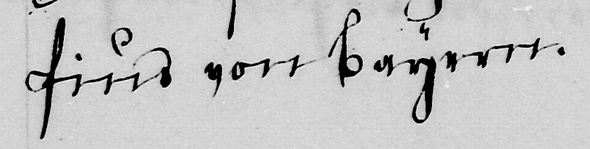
Pius von Bayern.
